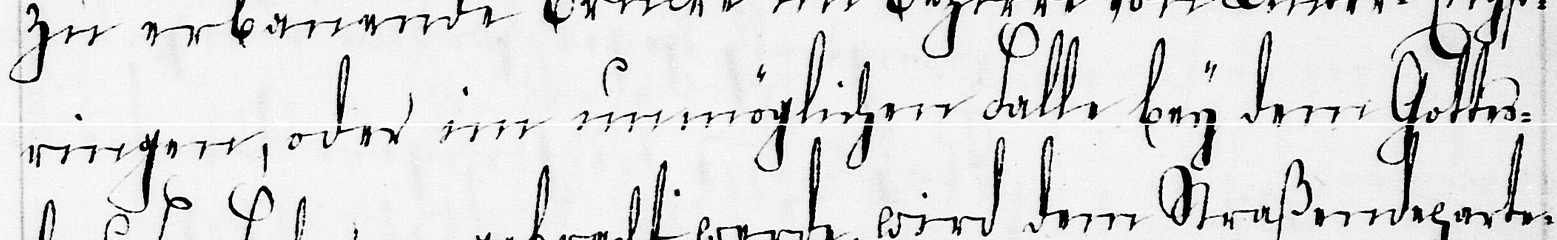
ringen, oder im unmöglichen Falle bey dem Gotte¬
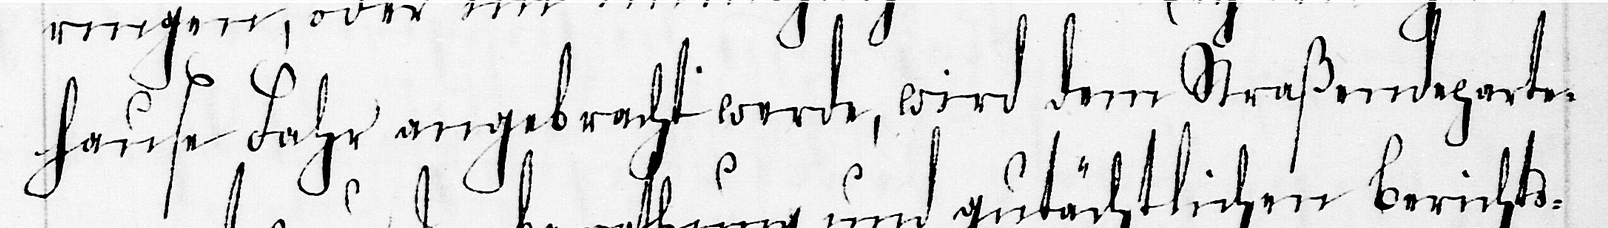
shause Fahr angebracht werde, wird dem Straßendeparte¬
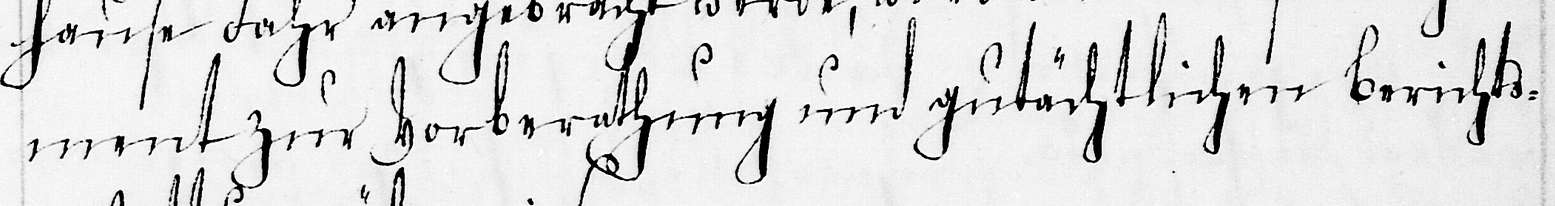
ment zur Vorberathung und gutächtlichen Berichts¬
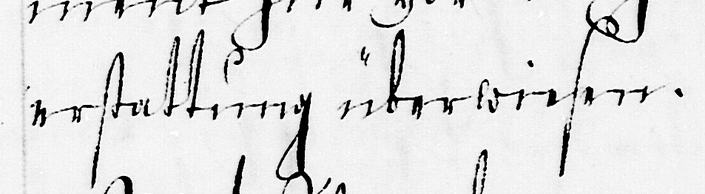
erstattung überwiesen.
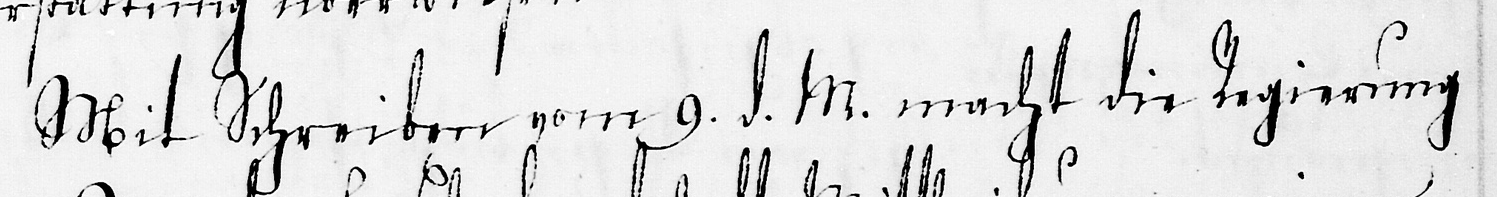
Mit Schreiben vom 9. d. M. macht die Regierung
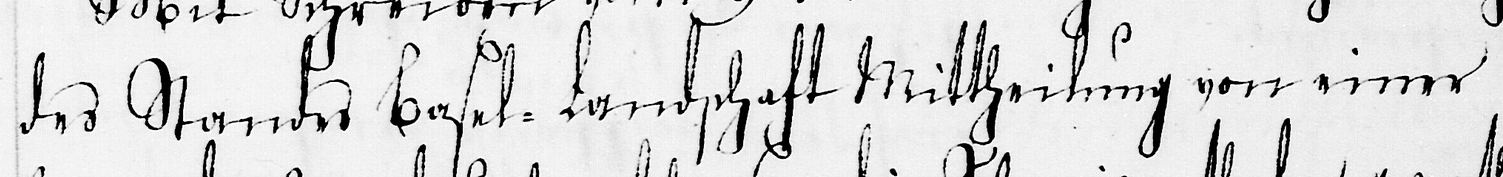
des Standes Basel-Landschaft Mittheilung von einer
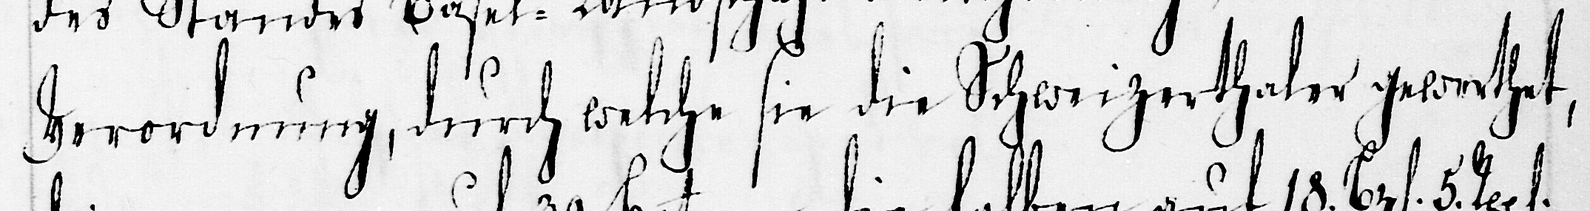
Verordnung, durch welche sie die Schweizerthaler gewerthet,
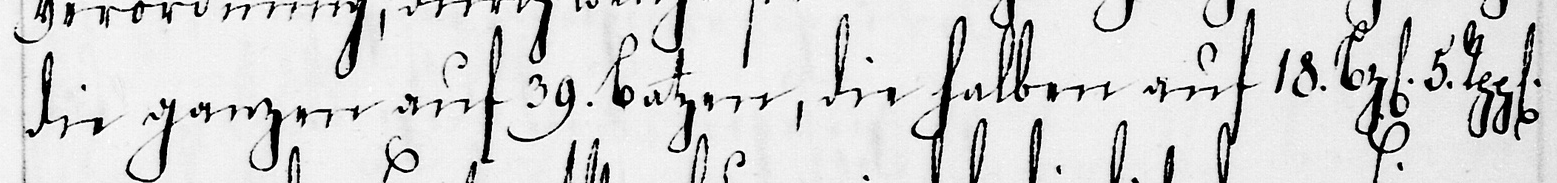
die ganzen auf 39. Batzen, die halben auf 18. Btz[en].
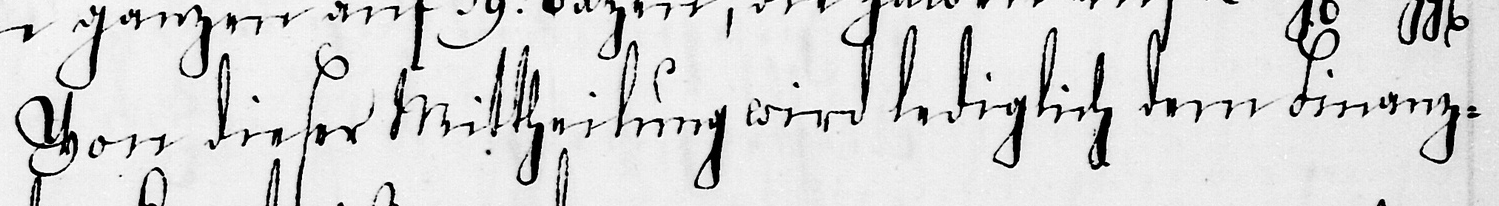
Von dieser Mittheilung wird lediglich dem Finanz¬
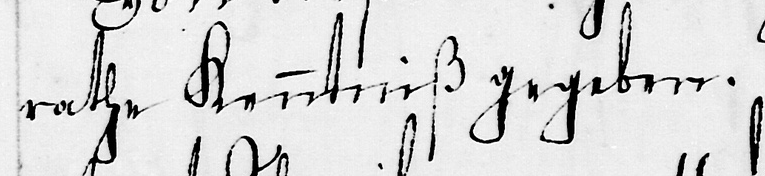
rathe Kenntniß gegeben.
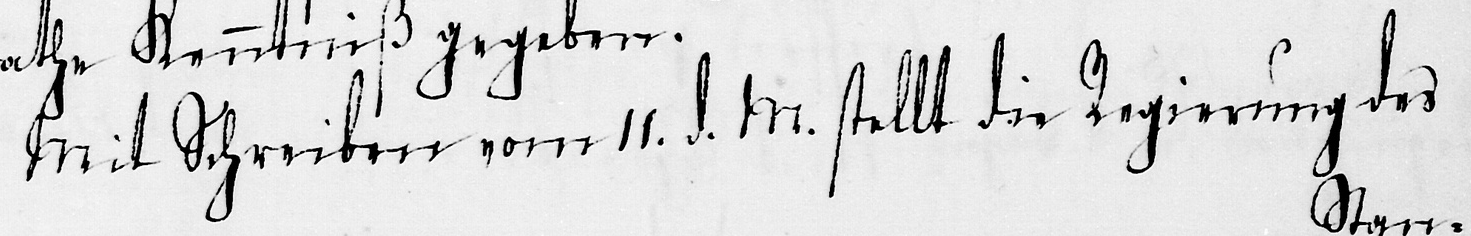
Mit Schreiben vom 11. d. M. stellt die Regierung des
